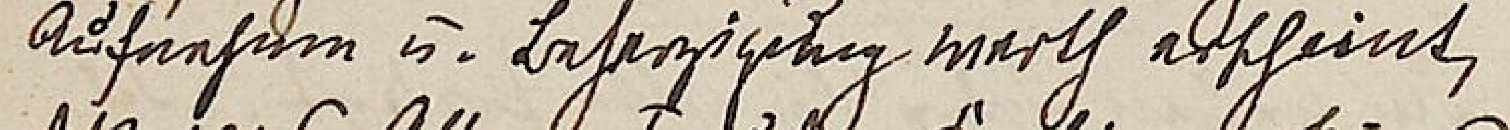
Aufnehmen u. Beherzigung werth erscheint,
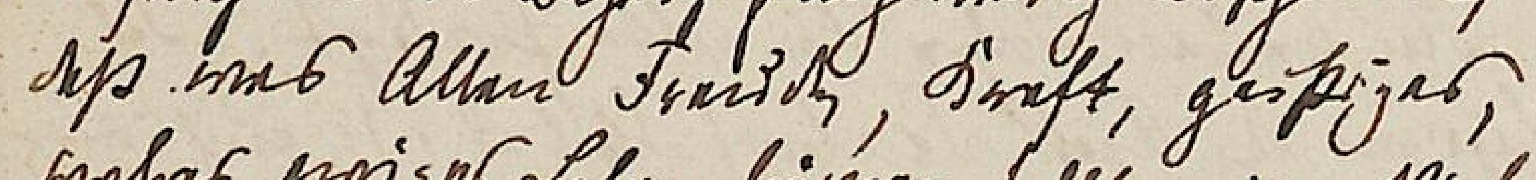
daß was Allen Freude, Kraft, geistiges,
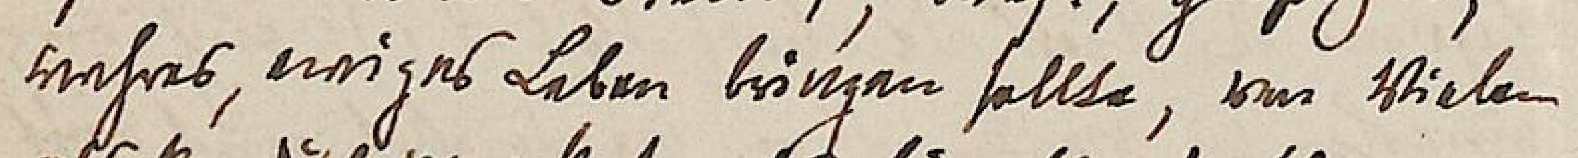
wahres, ewiges Leben bringen sollte, von Vielen
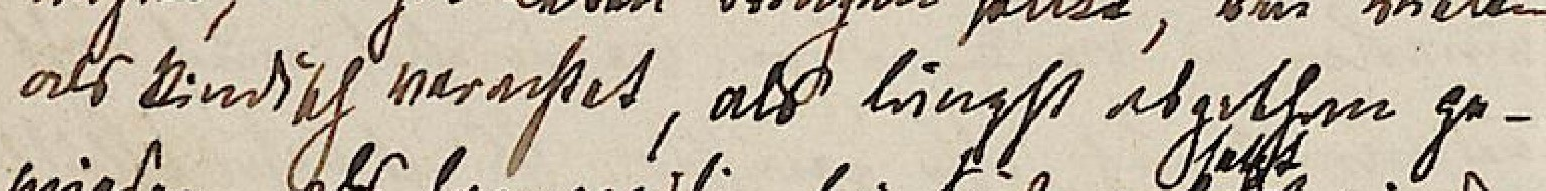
als kindisch verachtet, als längst abgethan ge¬
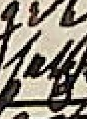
setzt
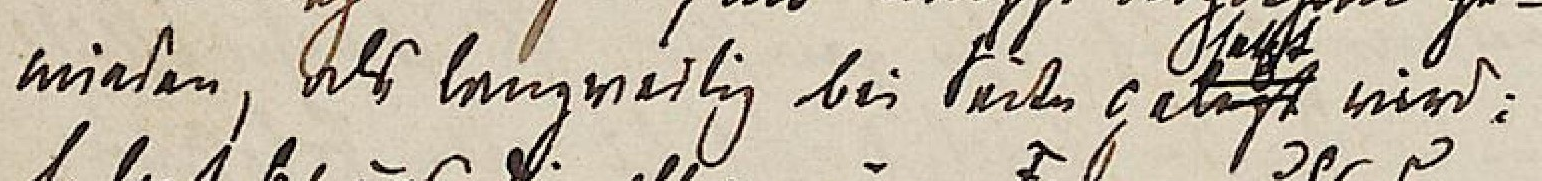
mieden, als langweilig bei Seite gelegt wird:
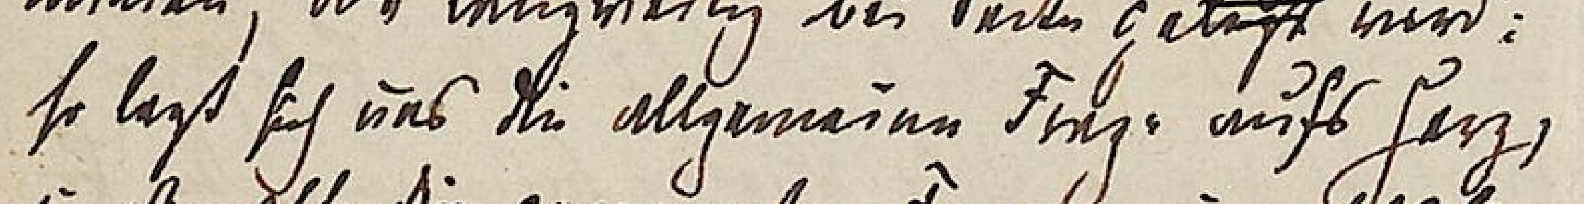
so legt sich uns die allgemeine Frage aufs Herz,
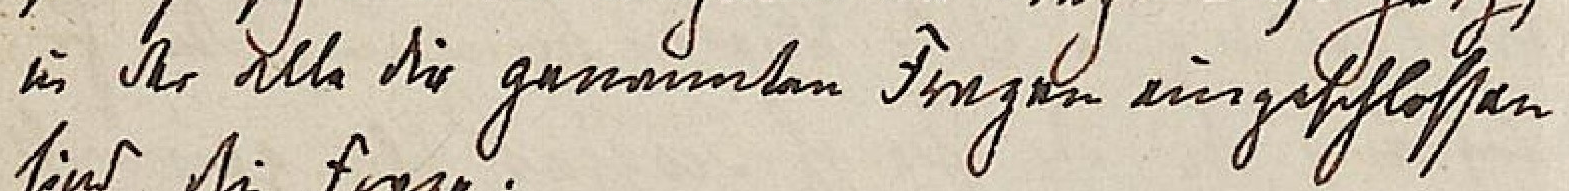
in der alle die genannten Fragen eingeschlossen
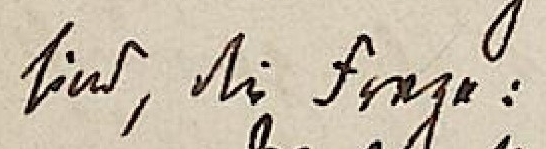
sind, die Frage:
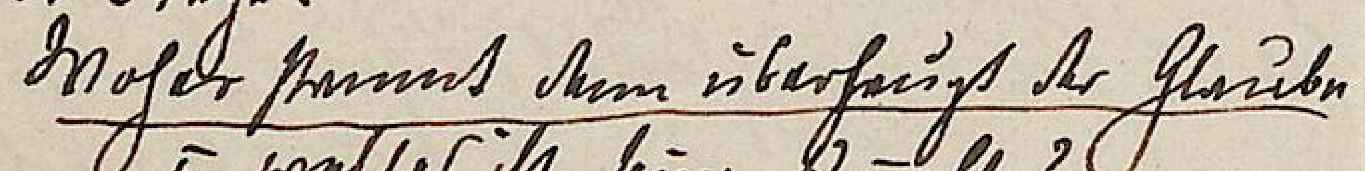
Woher stammt denn überhaupt der Glaube
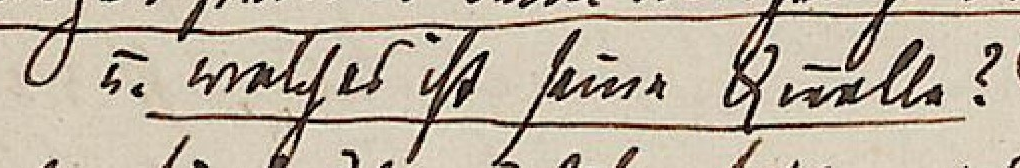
u. welches ist seine Quelle?
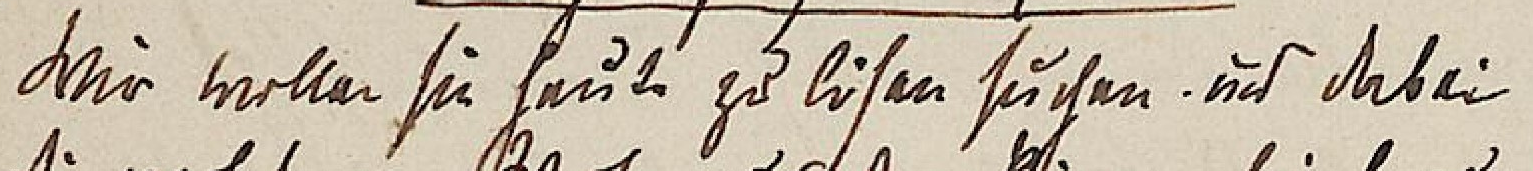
Wir wollen sie heute zu lösen suchen und dabei
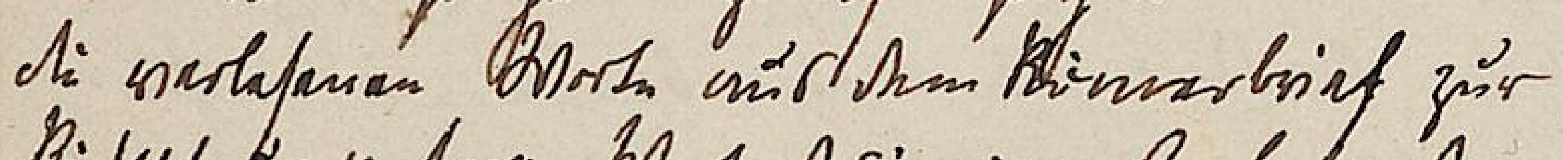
die verlesenen Worte aus dem Römerbrief zur
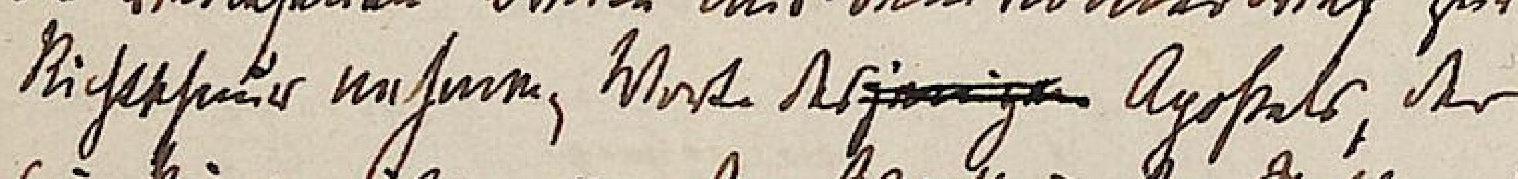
Richtschnur nehmen, Wort desjenigen Apostels, der
